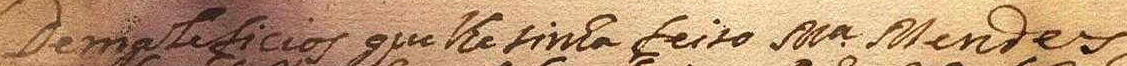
De maleficios que lhe tinha feito Ma. Mendes,
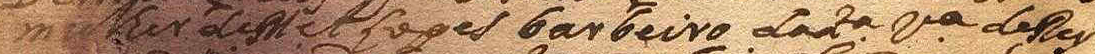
mulher de Mel Lopes barbeiro da d̄.a V.a de Rey
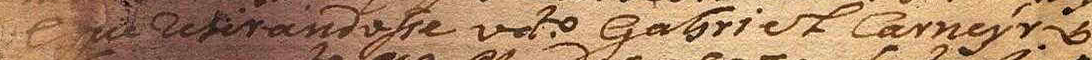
e que Retirandosse o d̄.o Gabriel Carneyro
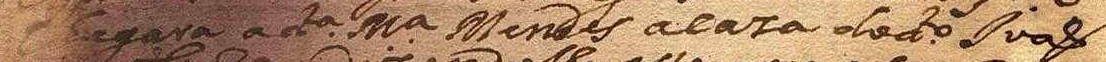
chegara a d̄.a M.a Mendes a caza do d̄o Ioaõ
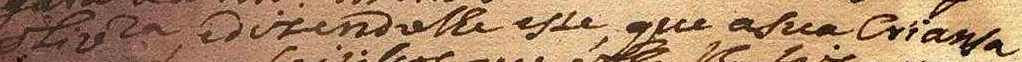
oLvra, e dizendolhe esse, que a sua criansa
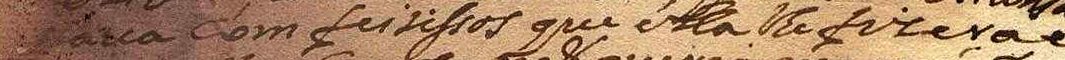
_aua com feitissos que ella lhe fizera e
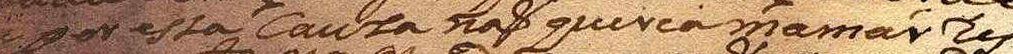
por esta cauza naõ queria mamar Res
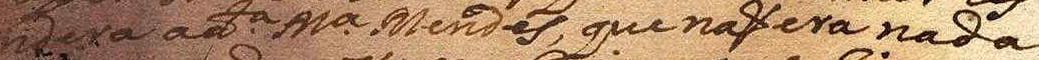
ndera a d̄.a M.a Mendes, que naõ era nada
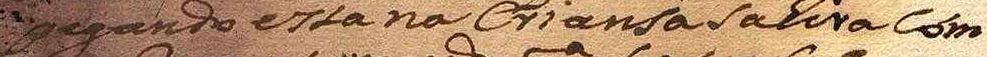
pegando esta na Criansa sahira com
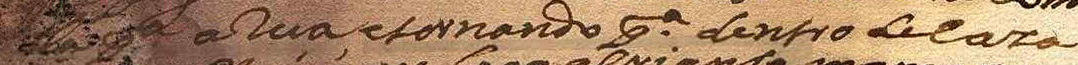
ela p.a a Rua, e tornando p.a dentro de caza
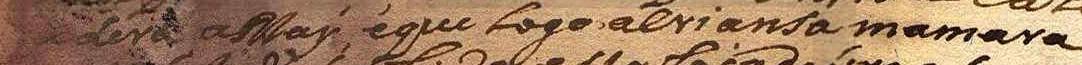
dera a May, e que logo a criansa mamara
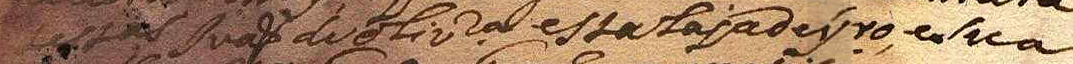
destas Ioaõ de oliv.ra estalajadeyro, e sua
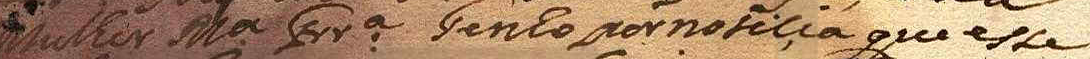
mulher M.a Frr.a Tenho por noticia que este
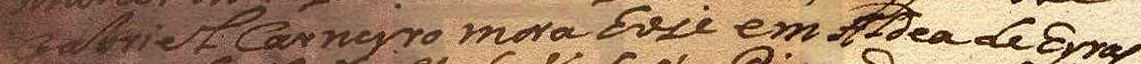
Gabriel Carneyro mora hoie em Aldea de Eyras
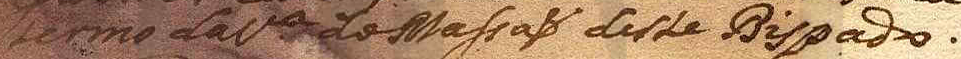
termo da V.a do Massaõ deste Bispado.
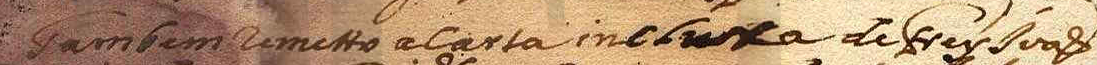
Tambem Remetto a carta incluxa de Frey Ioaõ
